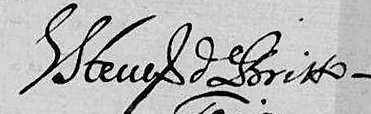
Esteuaõ de Britto
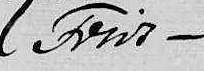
Foios -
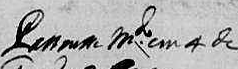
Passousse md.o em 4 de
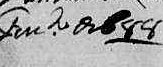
Feur.o de 688
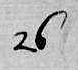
26
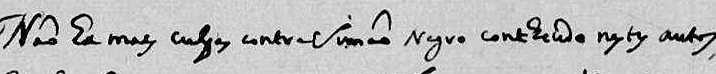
Naõ ha maes culpas contra Simaõ Negro contheudo nestes autos,
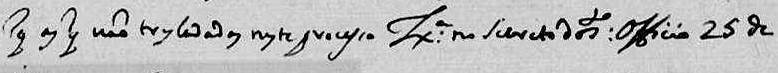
q̄ as q̄ uaõ tresladadas neste processo Lxa: no secreto do sto: officio 25 de
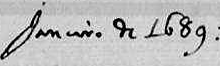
Janeiro de 1689:
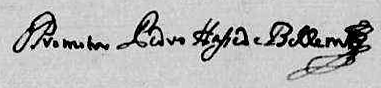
O Promotor Pedro Hasse de Bellem
